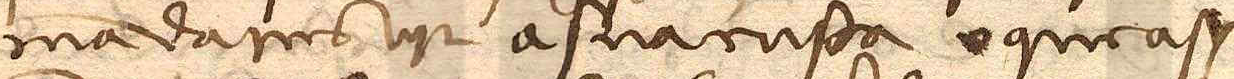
mādarees vyr a sua custa o que asy
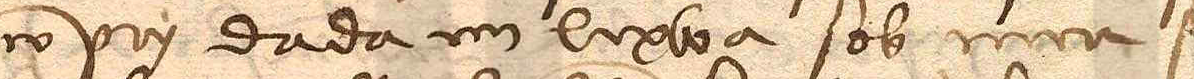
c̄opry dada em lixboa sob meu sy
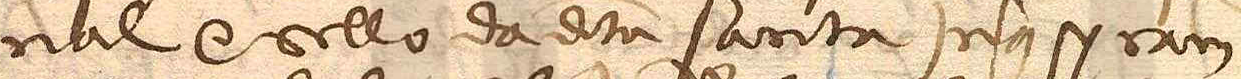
nal e sello da dta santa Jnq̄sycam
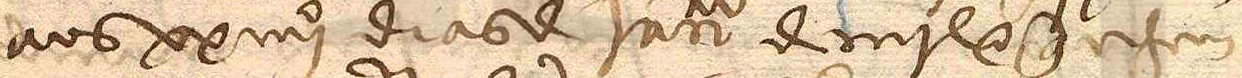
aos xxiiijo dias de Janro de mjl e q̄nhen
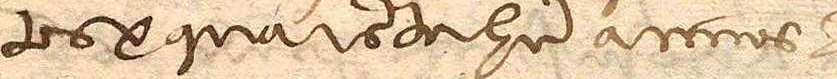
tos e quarēta hū annos
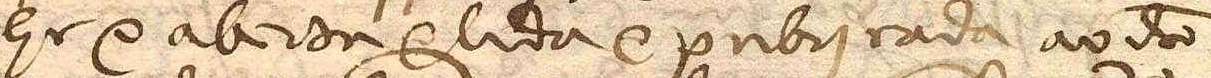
he e aberta e lida e pubrjcada ao d̄o
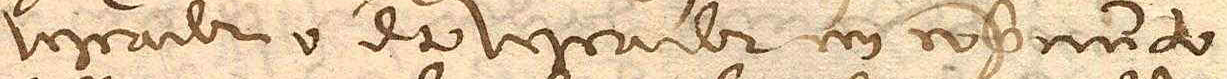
vereador o d̄to vereador em c̄op̄mēto
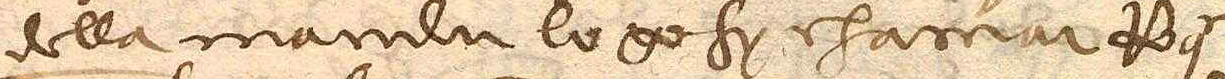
della mandou logo hy chamar Roqe
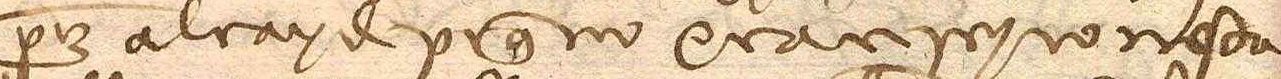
p̄iz alcayde peq̄no e cacereyro nesta
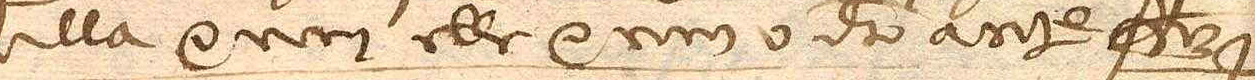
villa e com elle e com o d̄to anto fr̄rz
